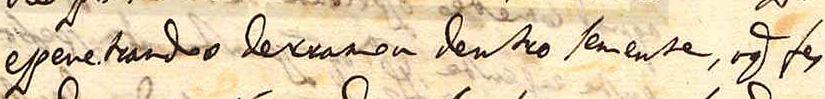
e penetrando o derramou dentro semente, o q̄ fes
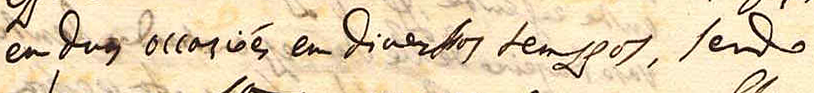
em duas occazioẽs em diuerssos tempos, sendo
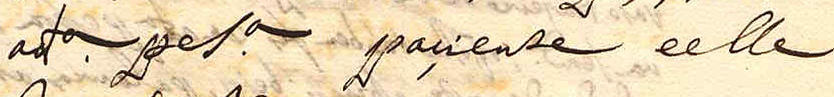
a d̄a. pes.a paçiente e elle
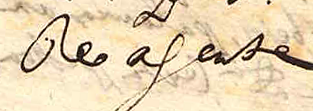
Reo agente
